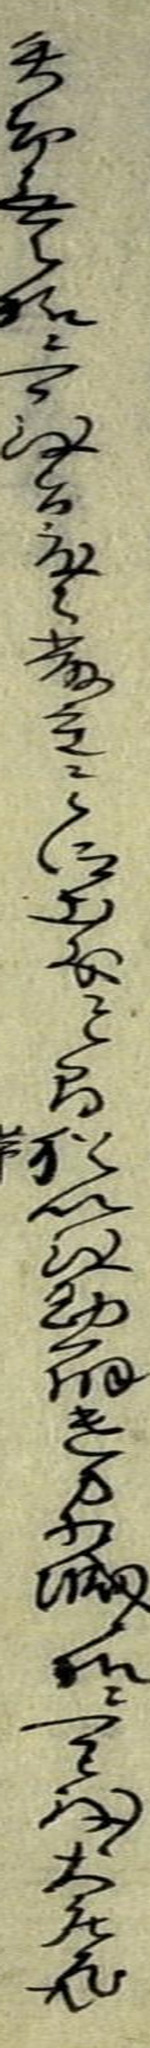失却無之様ニ可致旨度々厳重ニ被仰出義ニ候間猶以致勘弁遣方相減候様ニ可被致候大庄屋共
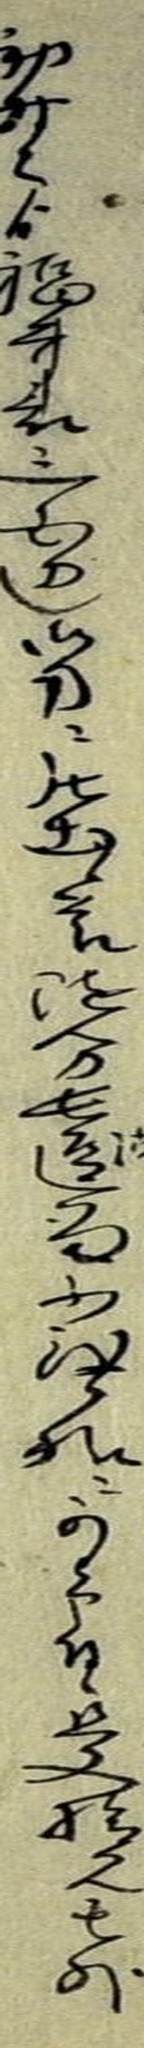初村々ゟ福井表三国辺御用ニ罷出候節随分長逗留不致候様ニ可被申付候且又検見其外
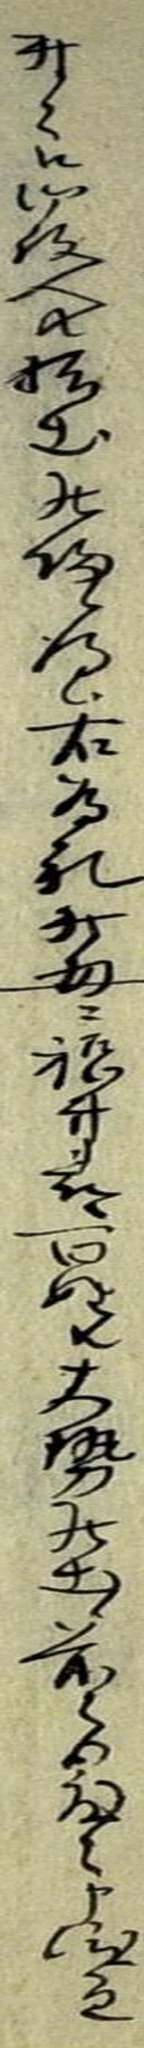村々江御役人共指出居儀候得ハ右為礼村毎ニ福井表へ百姓共大勢罷出候前々ゟ度々申渡置
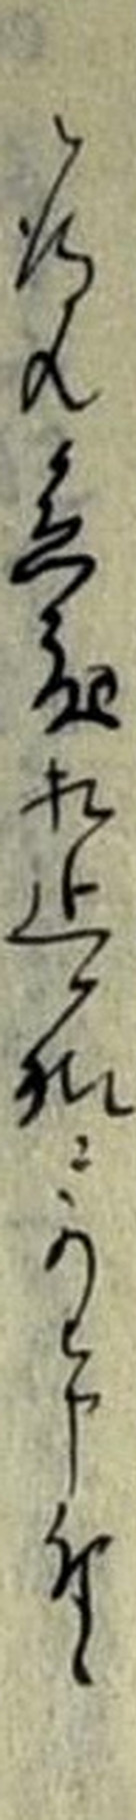候得共急度相止候様ニ可被申付候
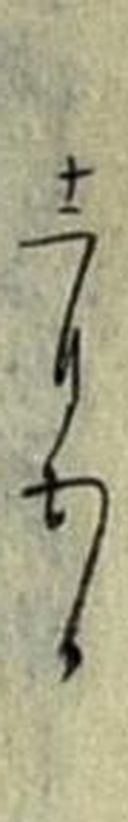十二月五日

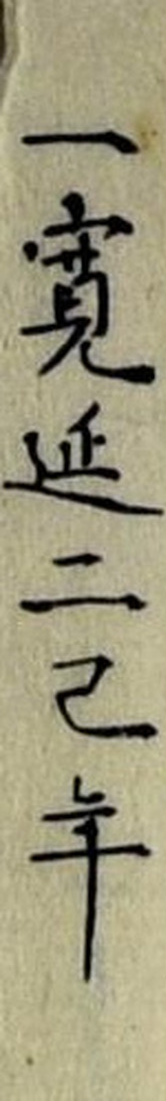一寛延二巳年
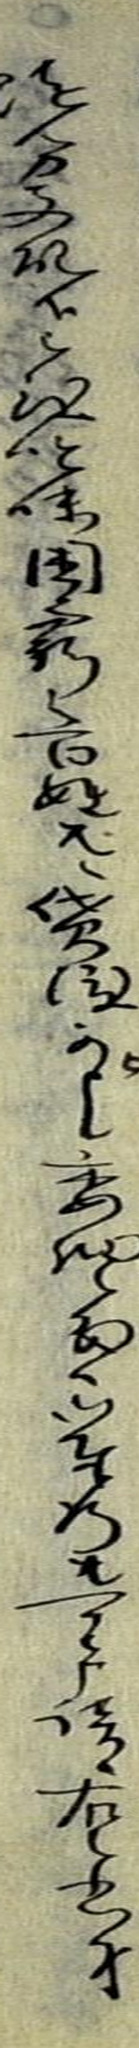随分支配下被致吟味困窮之百姓共へ貸渡可被申候委細之義ハ御奉行共可被申談候右之書付
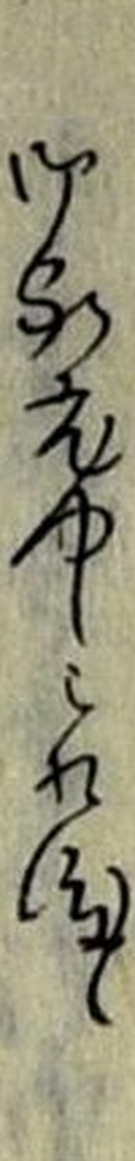御家老中被相渡候
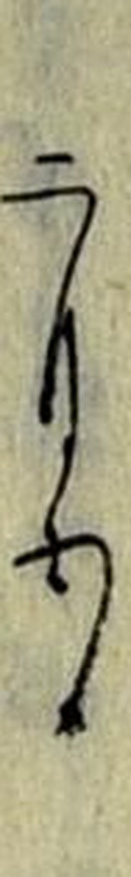二月五日
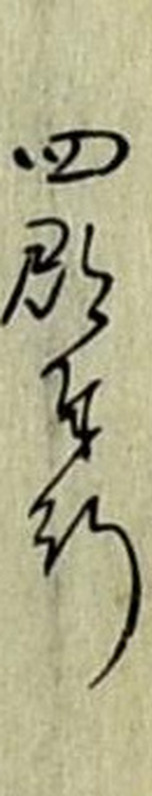四郡奉行
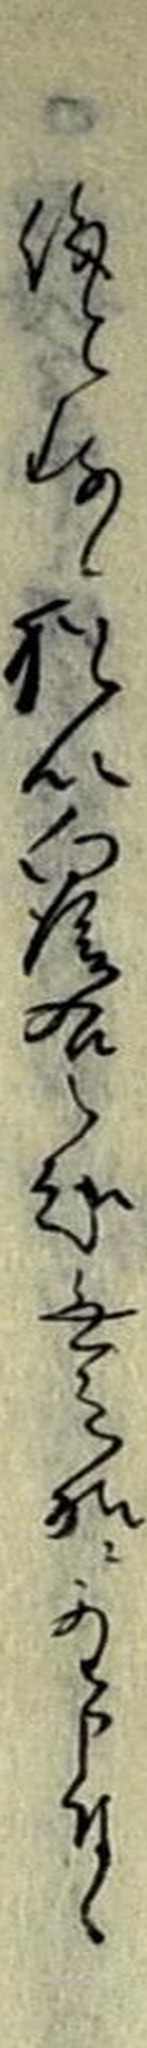儀と存候猶以向後右之趣無之様ニ可被申付候
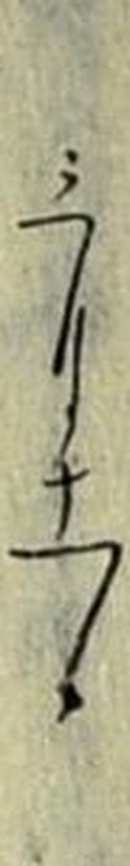三月十一日
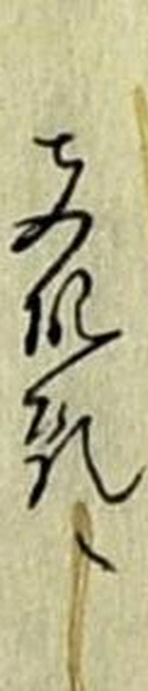支配頭へ
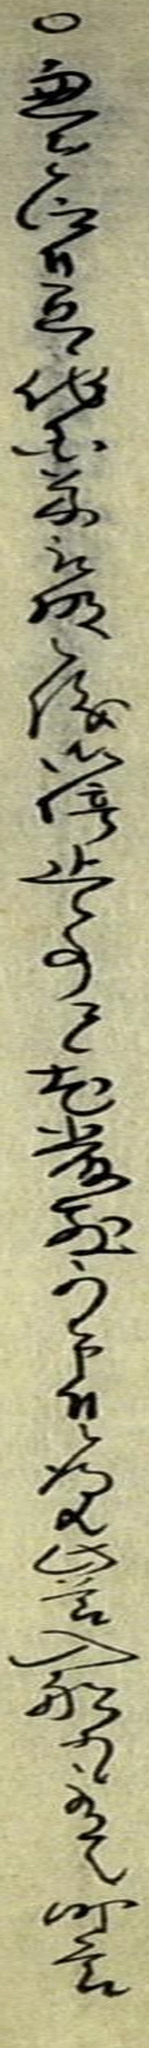〇兼而被仰付置候他国米取扱之儀御停止候事ニ候尤厳敷可被申付候得共此節入船等も有之御節
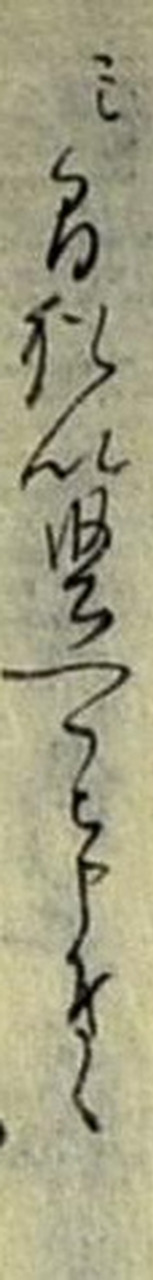ニ候間猶以堅可被申付候
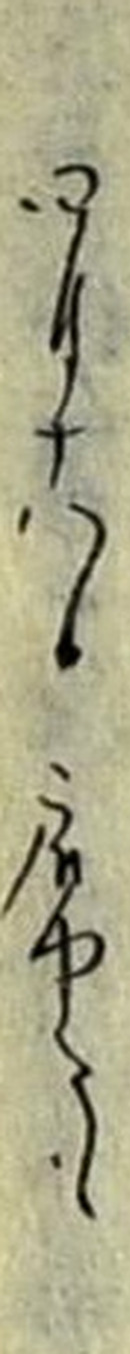四月十八日府中へも
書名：命令之部 一
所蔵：福井県文書館 Fukui Prefectural Archives
